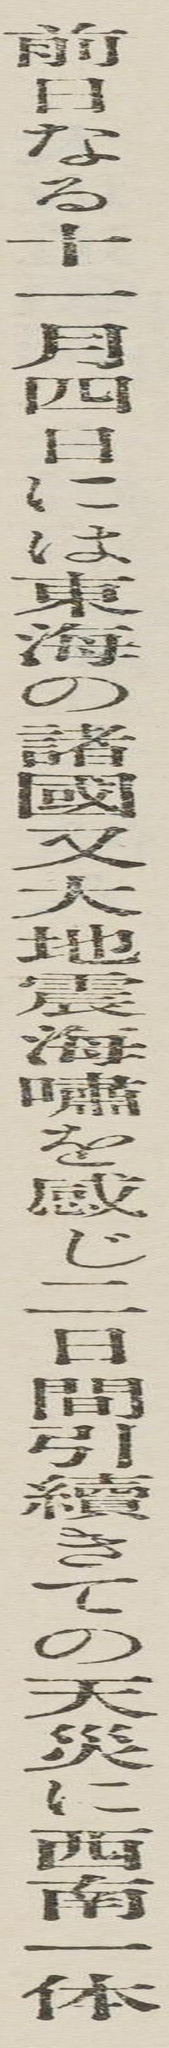前日なる十一月四日には東海の諸国又大地震海嘯を感じ二日間引続きての天災に西南一体
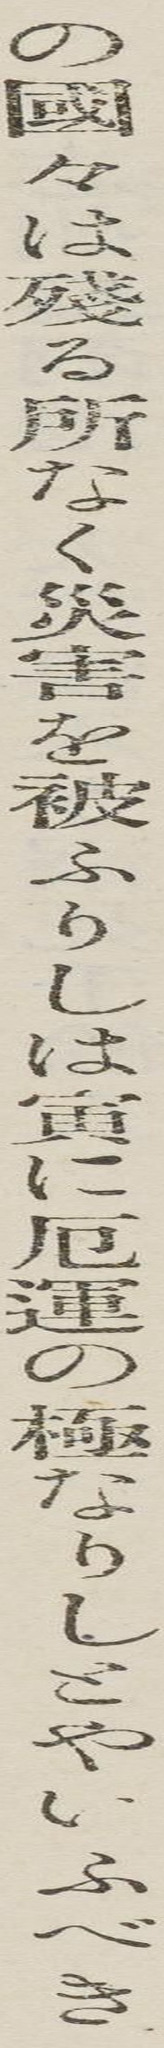の国々は残る所なく災害を被ふりしは寅に厄運の極なりしとやいふべき
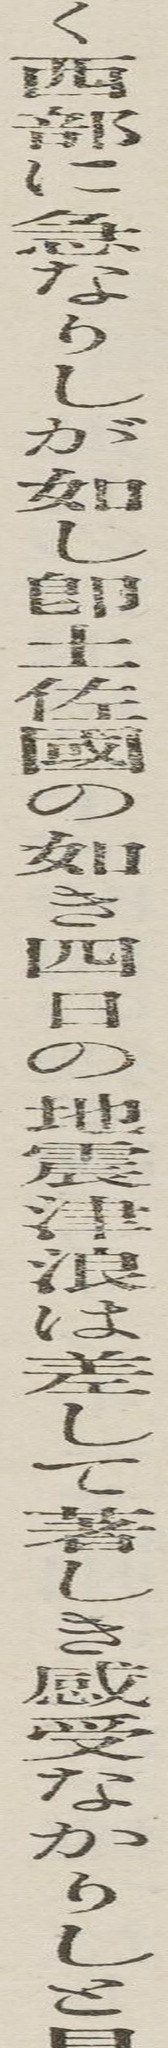く西部に急なりしが如し即土佐国の如き四日の地震津浪は差して著しき感受なかりしと見
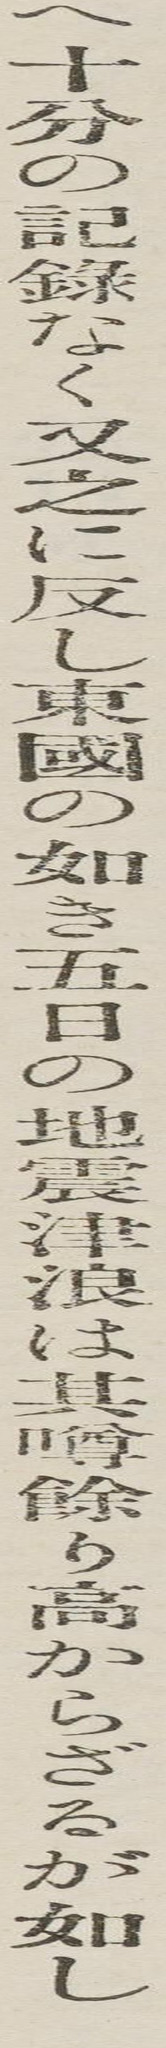へ十分の記録なく又之に反し東国の如き五日の地震津浪は其噂余り高からざるが如し
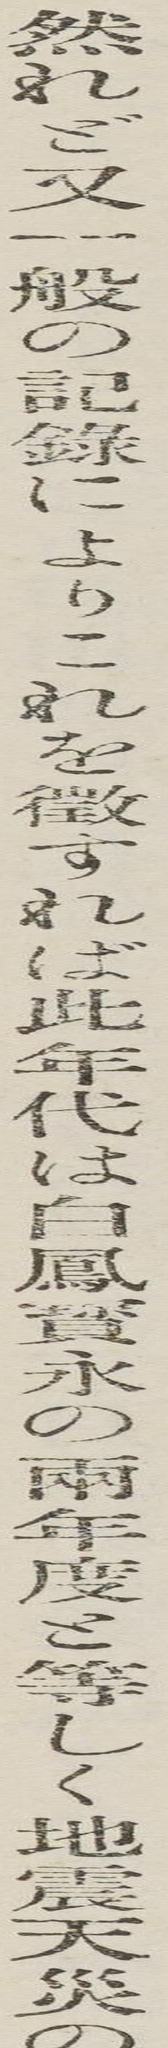然れど又一般の記録によりこれを徴すれば此年代は白鳳宝永の両年度と等しく地震天災の
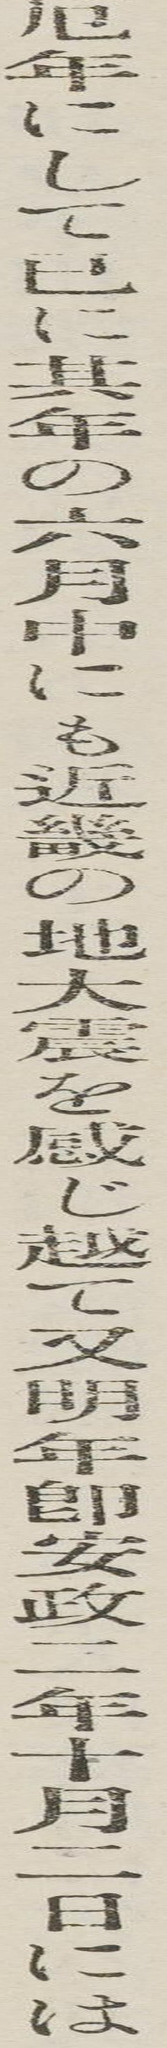厄年にして已に其年の六月中にも近畿の地大震を感じ越て又明年即安政二年十月二日には
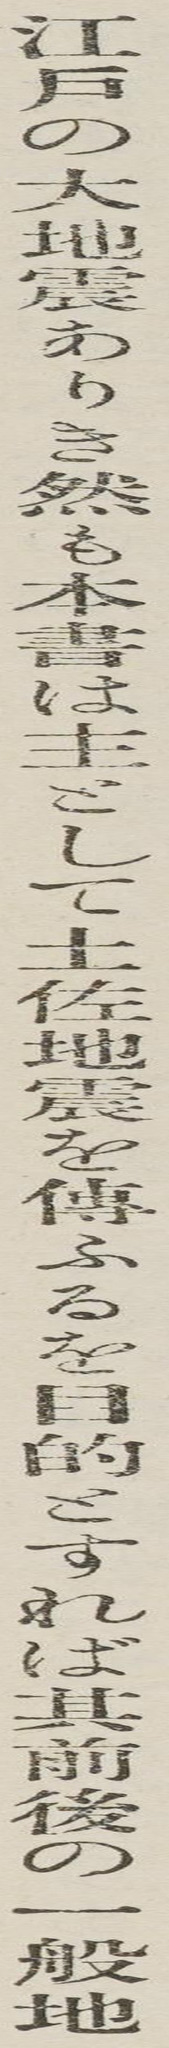江戸の大地震ありき然も本書は主として土佐地震を伝ふるを目的とすれば其前後の一般地
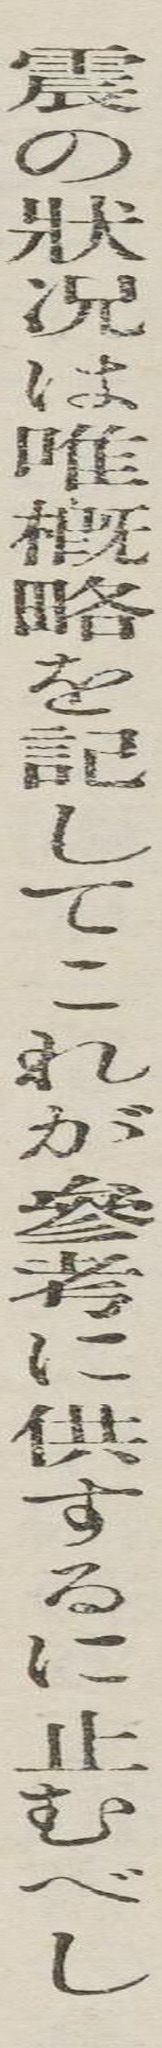震の状況は唯概略を記してこれが参考に供するに止むべし
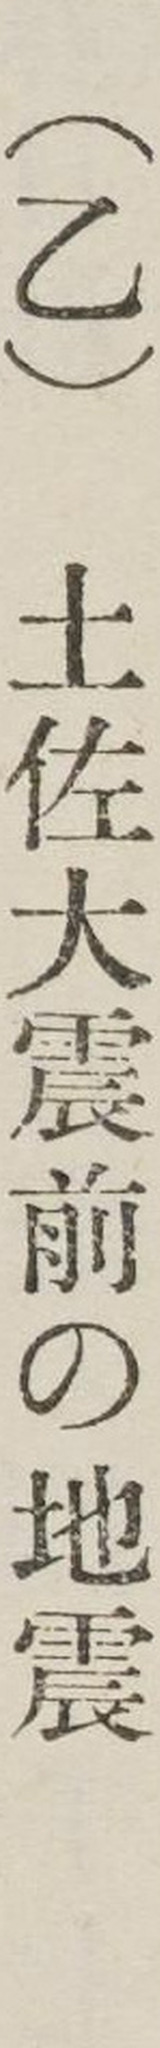土佐大震前の地震
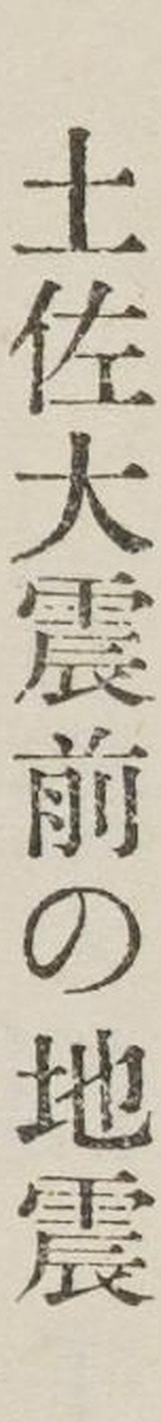土佐大震前の地震
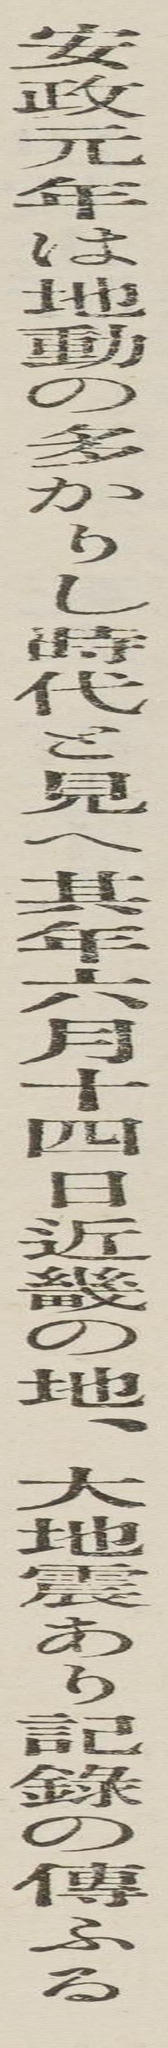安政元年は地動の多かりし時代と見へ其年六月十四日近畿の地、大地震あり記録の伝ふる
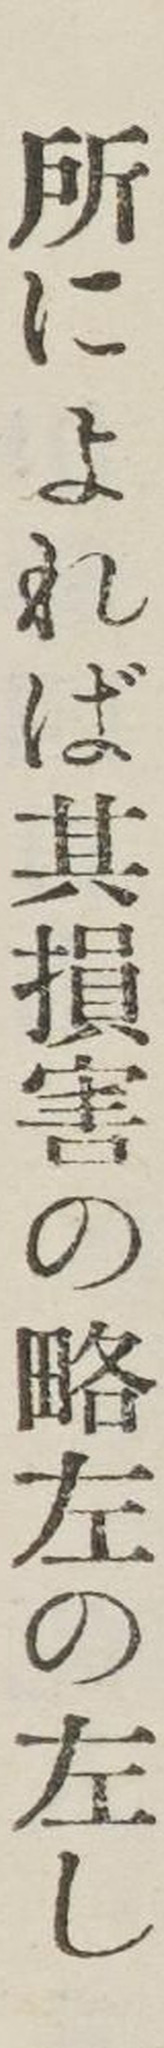所によれば其損害の略左の左し

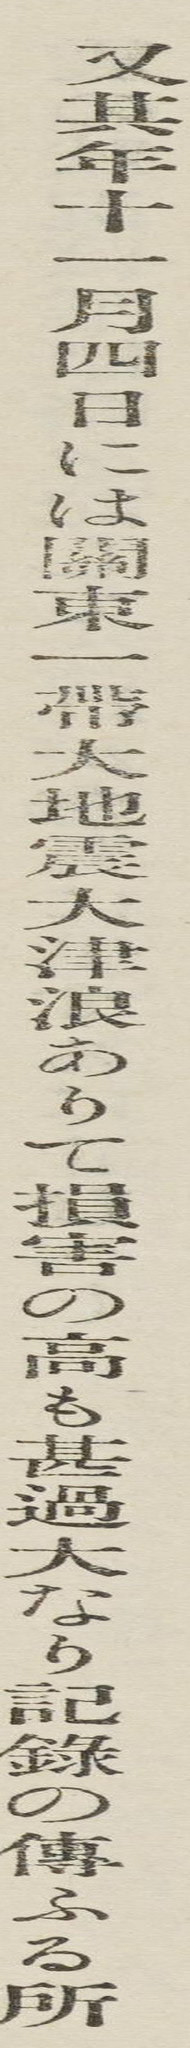又其年十一月四日には関東一帯大地震大津浪ありて損害の高も甚過大なり記録の伝ふる所
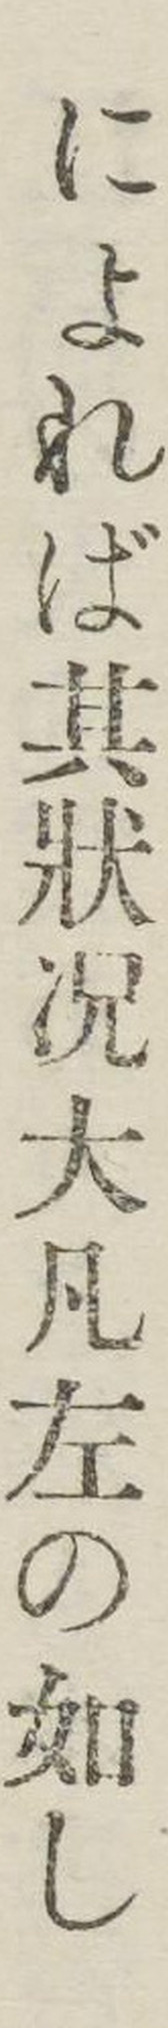によれば其状況大凡左の如し
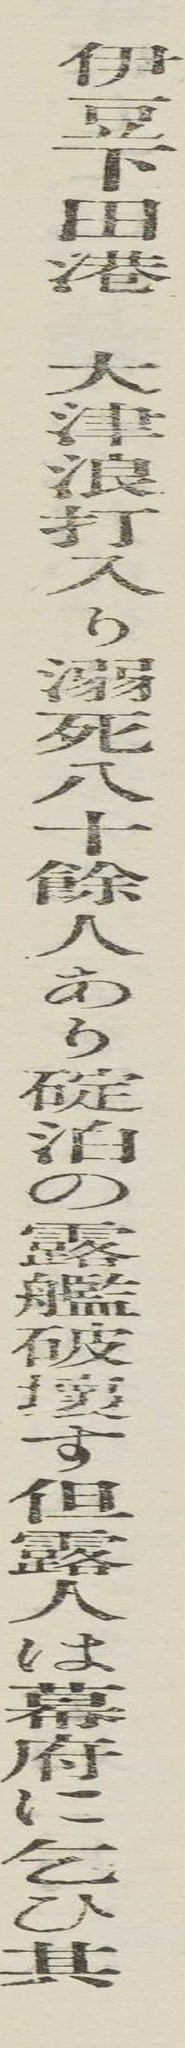伊豆下田港大津浪打入り溺死八十余人あり碇泊の露艦破壊す但露人は幕府に乞ひ其
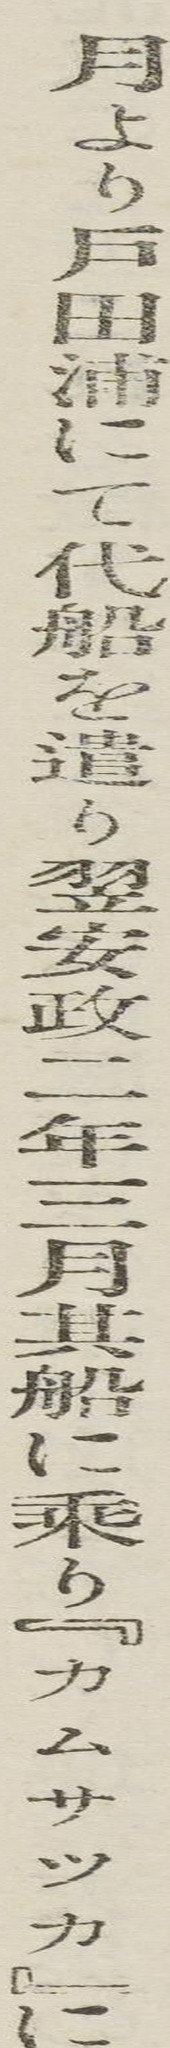月より戸田浦にて代船を遣り翌安政二年三月其船に乗り『カムサツカ』に
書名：土佐古今ノ地震
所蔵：東京大学地震研究所図書室 Earthquake Research Institute Library, The University of Tokyo, JAPAN
